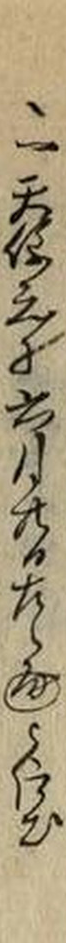一天保元寅六月廿日左之通被仰出
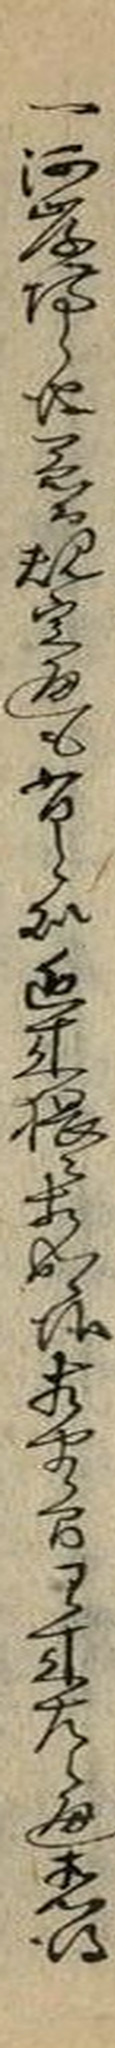一河岸場之儀兼而規定通も有之候処近来猥ニ相成候趣相聞候間已来左之通相心得
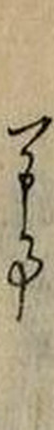可申事
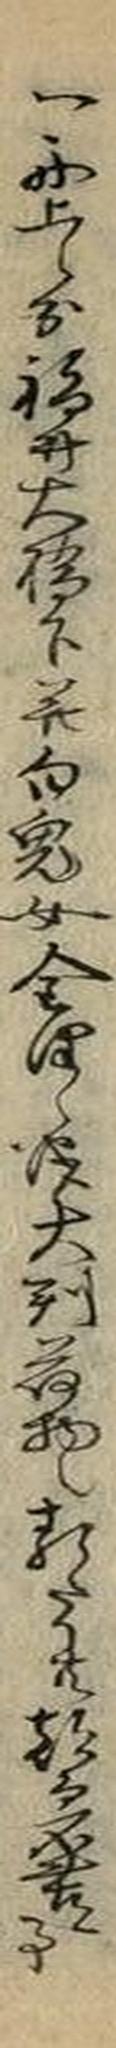一舟上之分福井大橋下幷白鬼女金津之儀ハ大判荷物之類たり共都而不苦候事
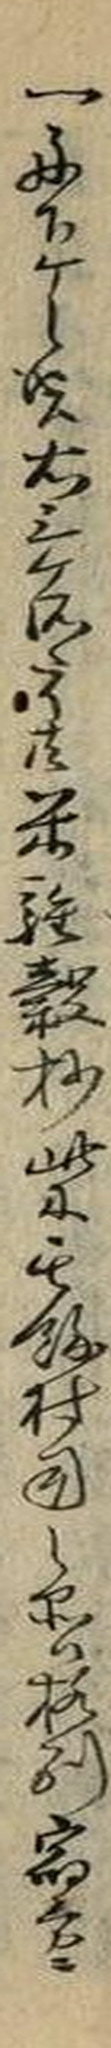一舟下ケ之儀ハ右三ケ所たり共米雑穀杪柴其余村用之品ハ格別宿方ニ
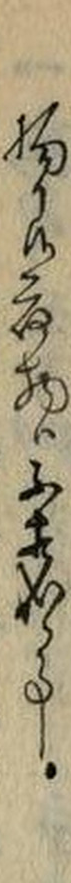拘り候荷物ハ不相成候事
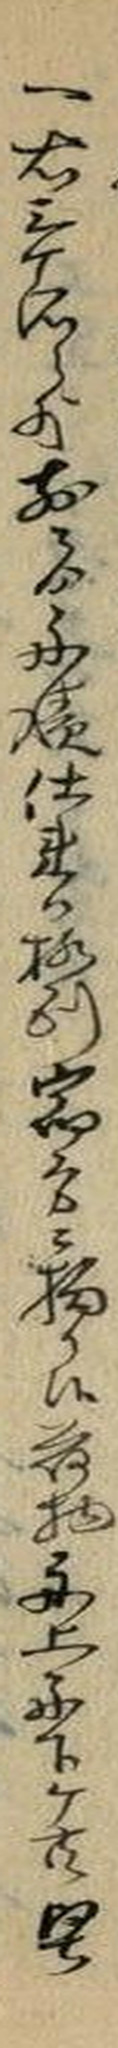一右三ケ所之外前々ゟ舟積仕来ハ格別宿方ニ拘り候荷物舟上舟下ケ共堅
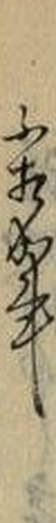不相成事
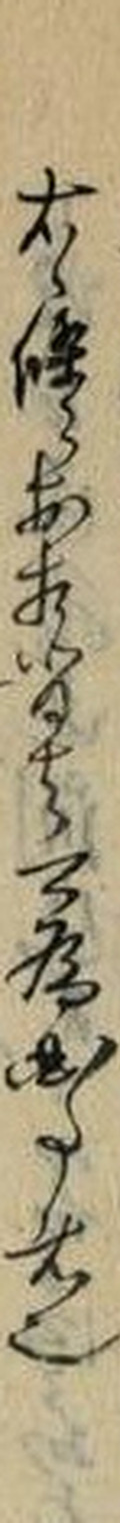右之条々於相背者可為曲事者也
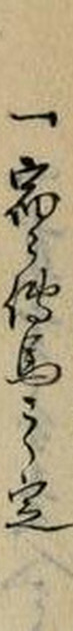一宿々伝馬之定
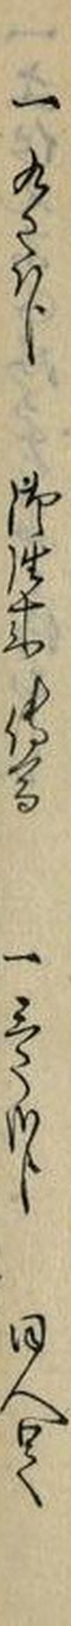一九匁弐歩御往来伝馬一三匁弐歩同人足
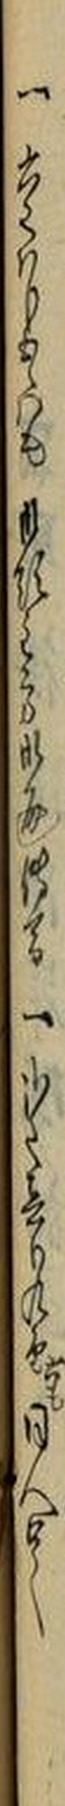一六匁弐歩五厘八毛御領主方御通伝馬一弐匁壱分九厘六毛同人足
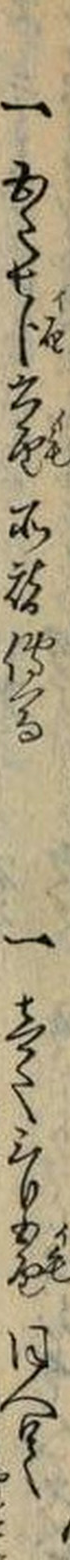一五匁七歩六厘所替伝馬一壱匁三歩五厘同人足
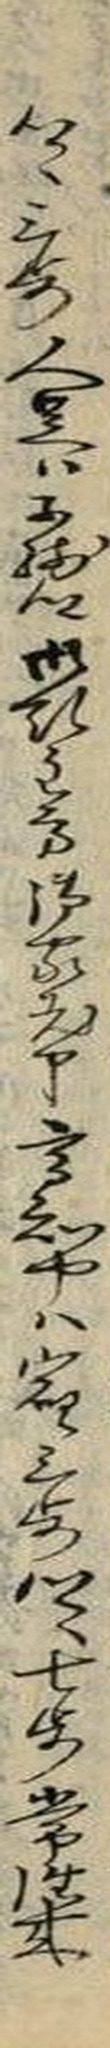郷へ三歩人足ハ不残郷御領主方御家老中高知中ハ宿へ三歩郷へ七歩常往来
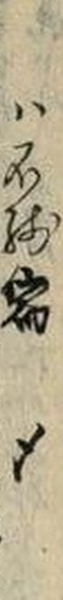ハ不残宿〆
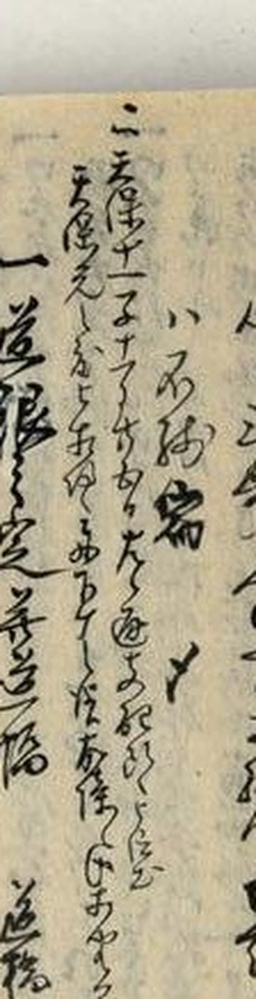一天保十一子十一月廿五日左之通支配頭へ被仰出
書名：御国他国諸事之部
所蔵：福井県文書館 Fukui Prefectural Archives
